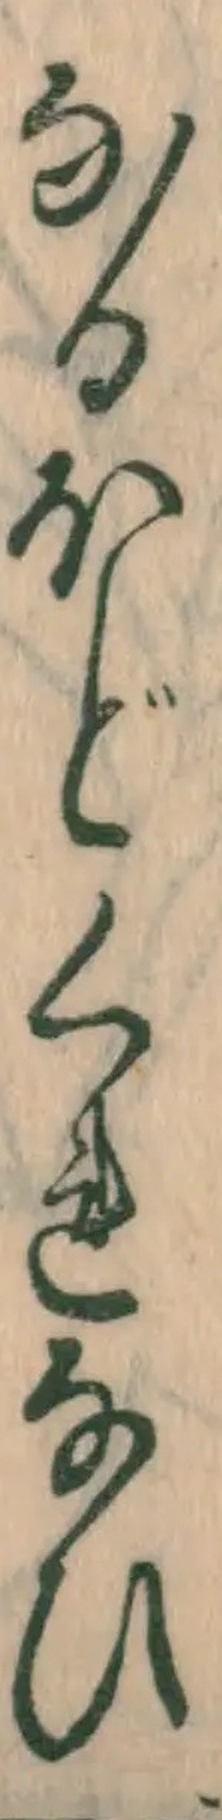なるほどくれなひ
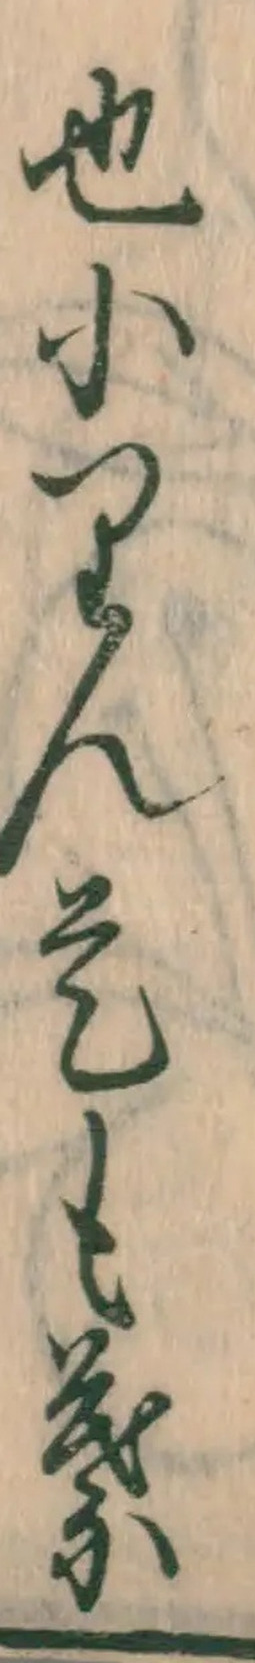也小りん是も葉
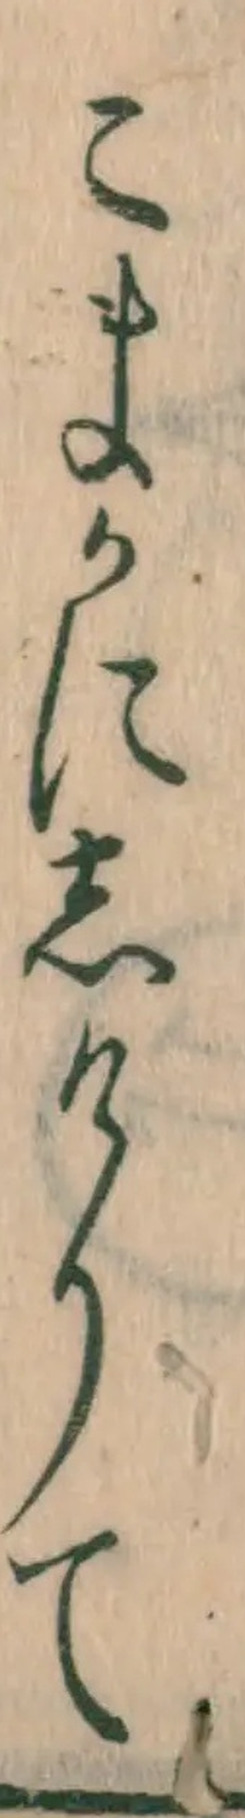こまかにしけりて
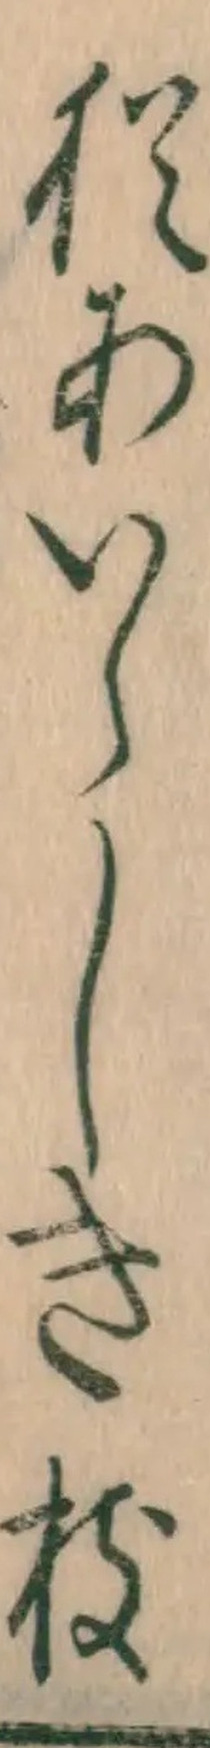猶あいらしき枝
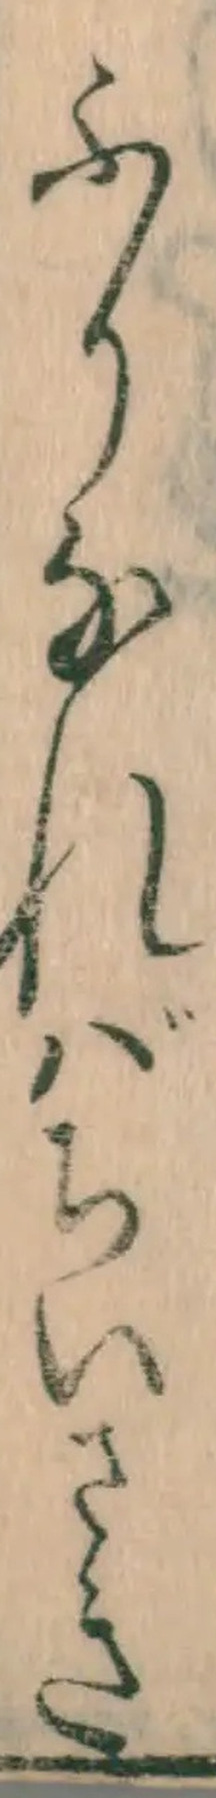ふりなればちいさき
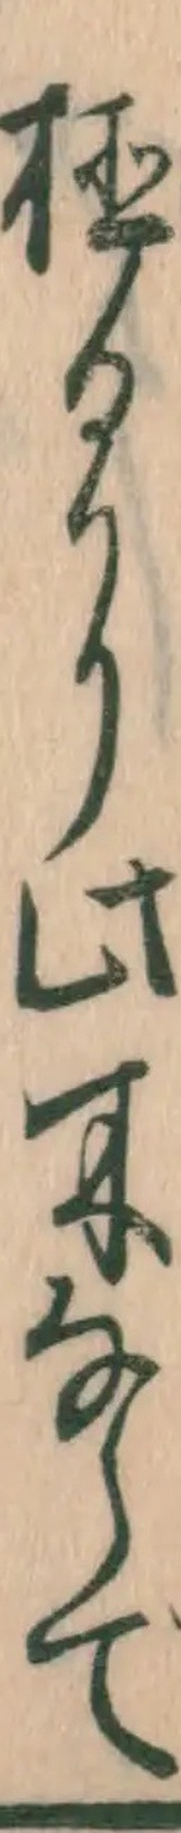植るに此木ならで
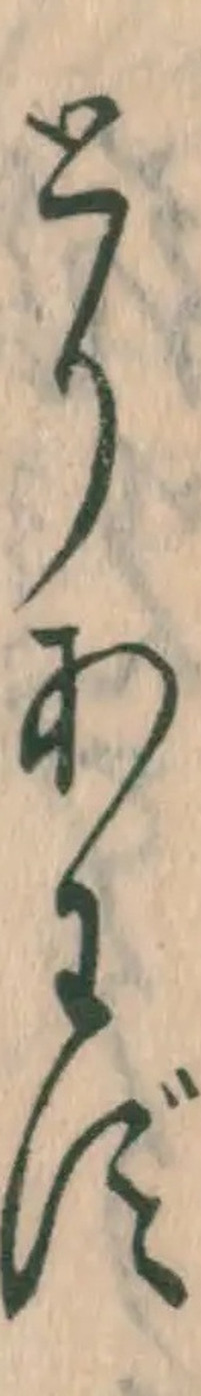とりあわず
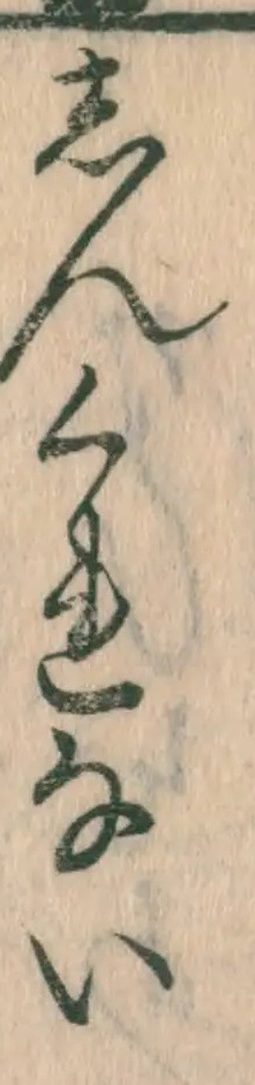●しんくれない
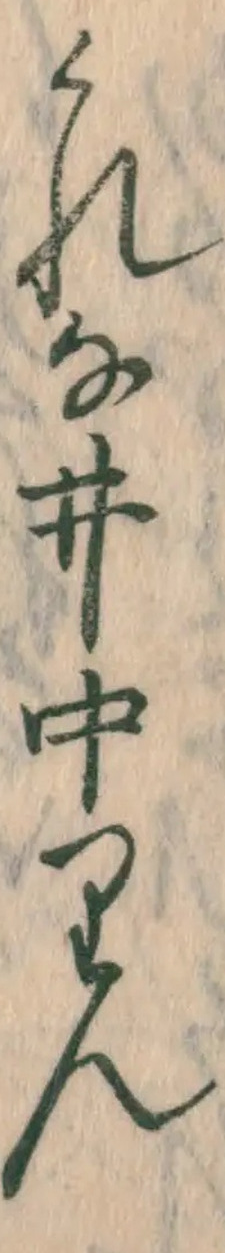くれない中りん
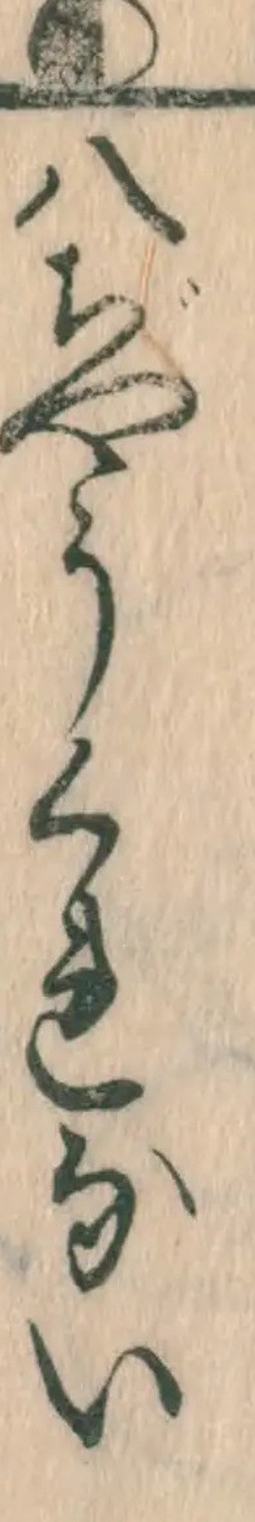八ぢやうくれない
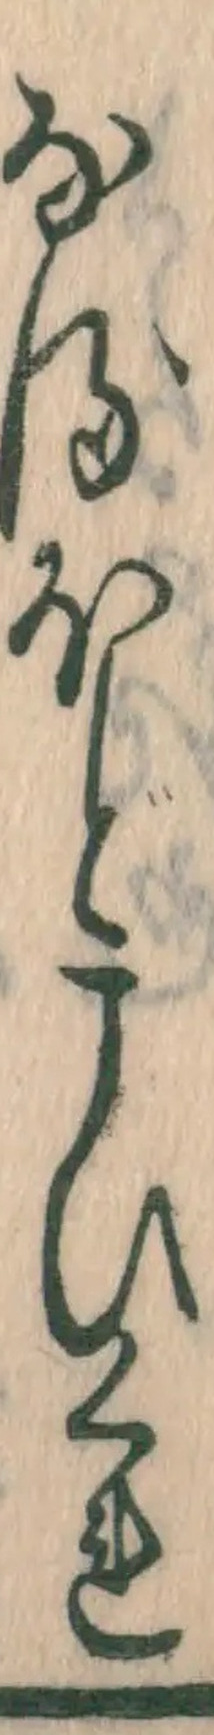なるほどこひくれ
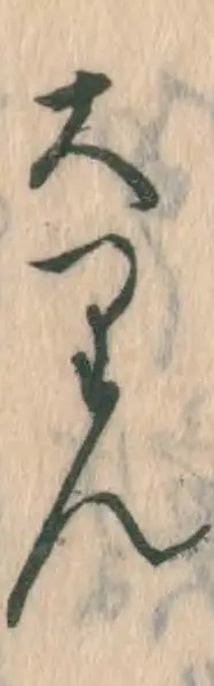大りん

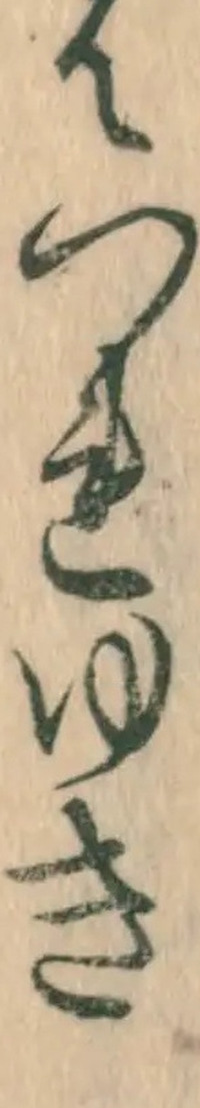はつれゆき
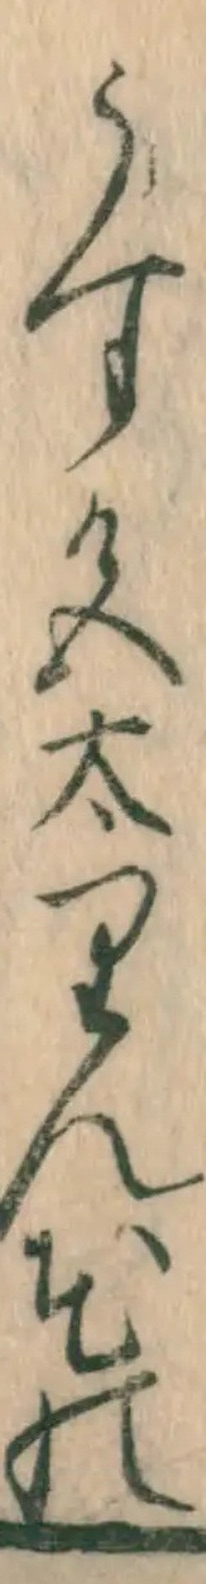うす色太りん花の
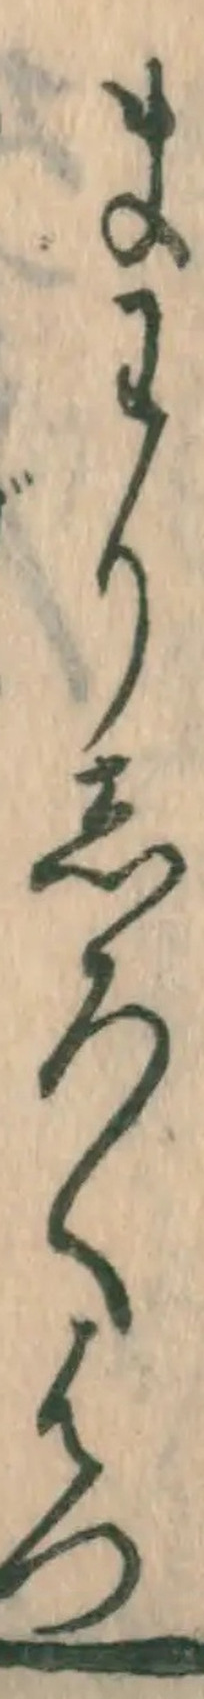まわりしろくはつ
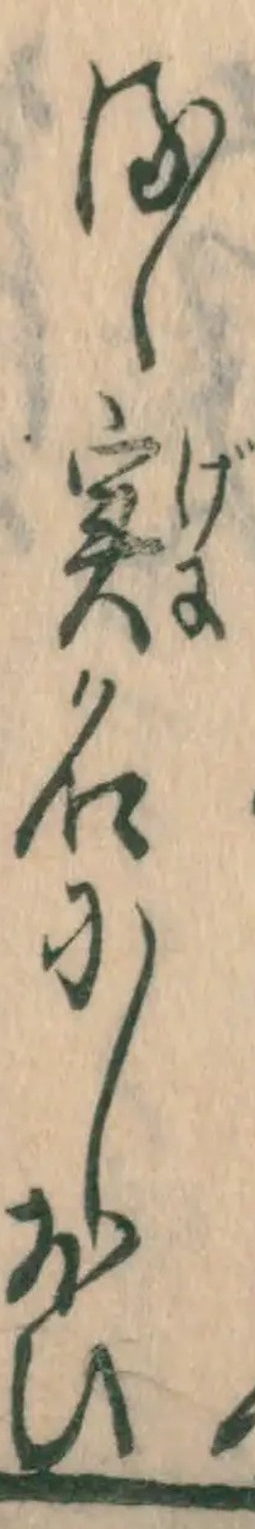るゝ実名にしおひ
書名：錦繍枕 5巻. [4]
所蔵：国立国会図書館 National Diet Library, JAPAN
